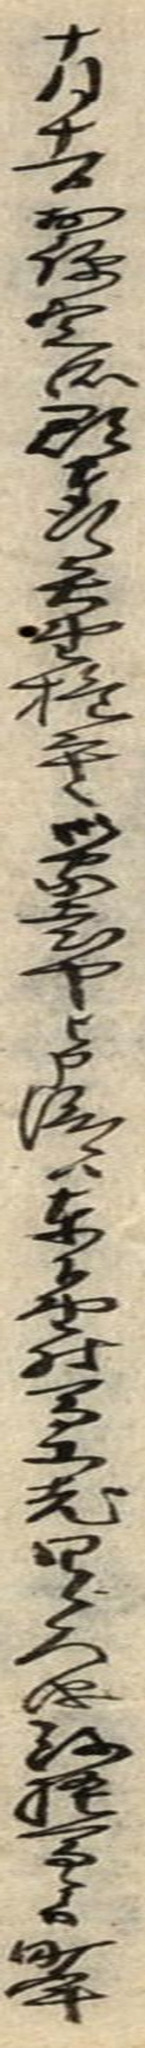十月十一日於評定所郡奉行矢野権平へ御家老中被申渡候は東下野村馬工老四郎右衛門儀致捨馬候に付町牢
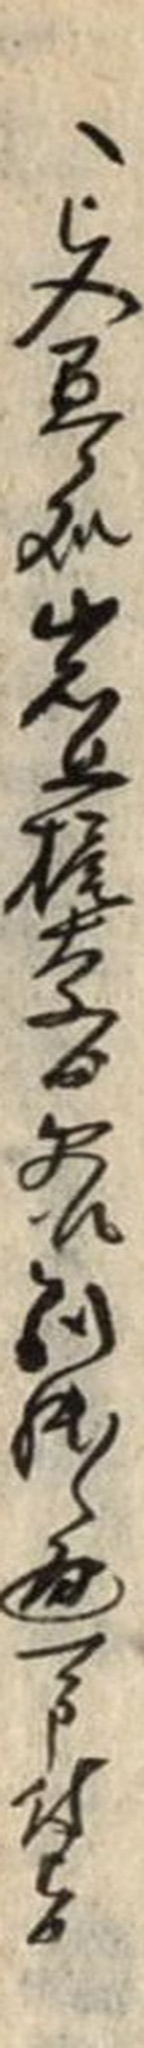へ被入置候処岩上梶大夫ゟ受取別紙之通可申付旨
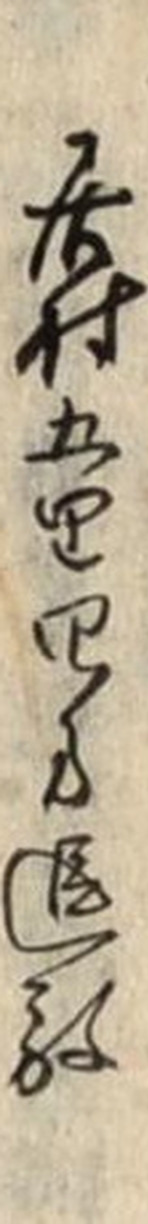居村五里四方追放
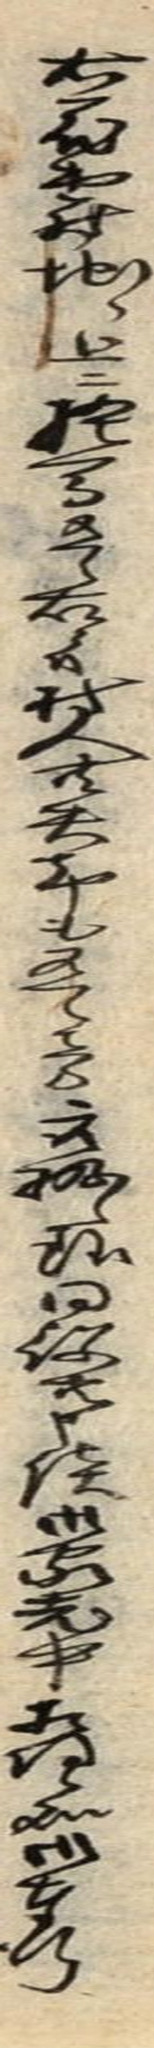右花堂村地ノ上に捨馬有之右に付村人共失却も有之旁取扱候趣同役共申談御家老中相伺候処御奉行
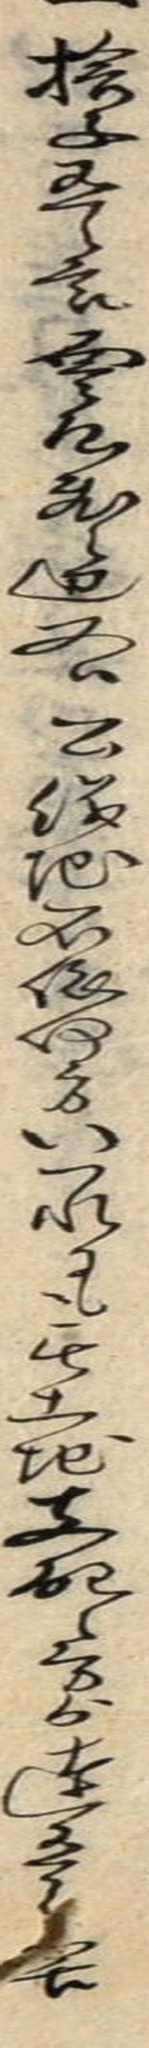一捨子有之節面々屋敷之辺又は公儀地不依何方いつれにも其土地支配之方ゟ達有之筈
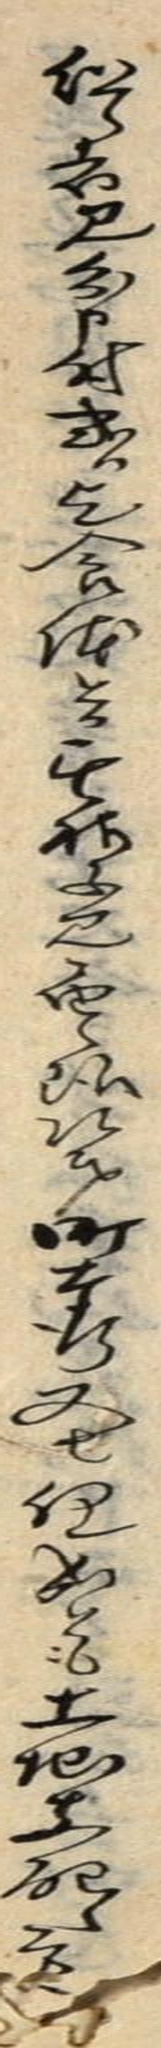組之者見分申付或は乞食体とか其様子見届候趣次第町奉行又は何レ成とも土地支配之方へ

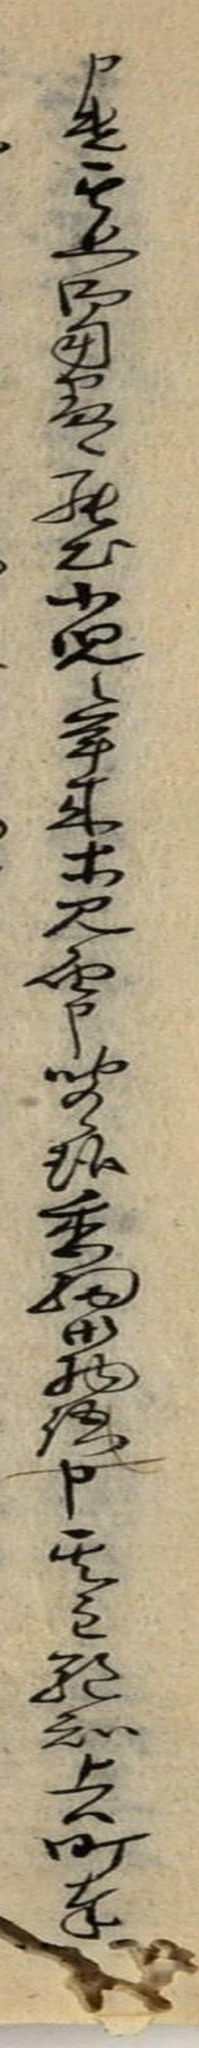申遣其上御用番へ罷出小児之年来等見届申聞候趣委細御物語申其主難知上は町奉
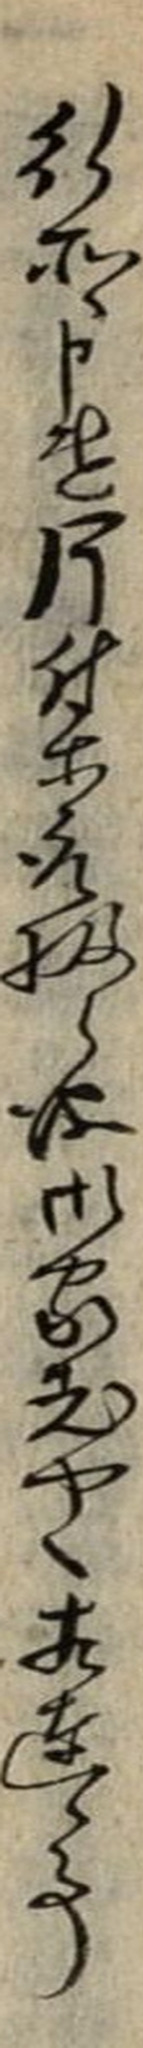行所へ申遣片付等取扱之儀御家老中へ相達候事
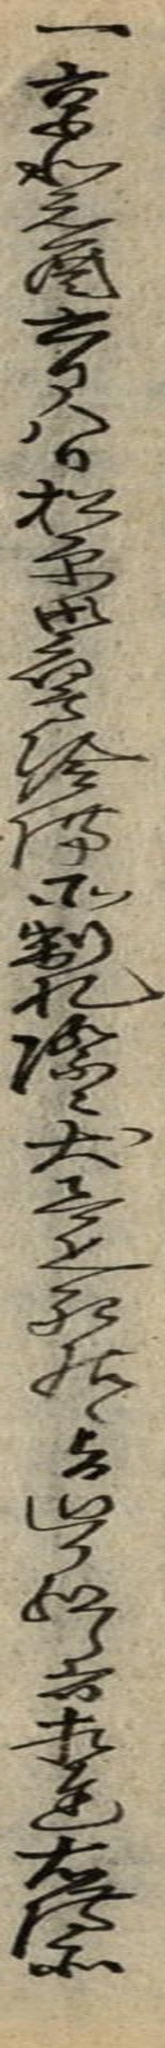一享和元酉六月八日松原御鷹冷場所制札際に犬壱疋死居候旨廻り組之者相達右場所
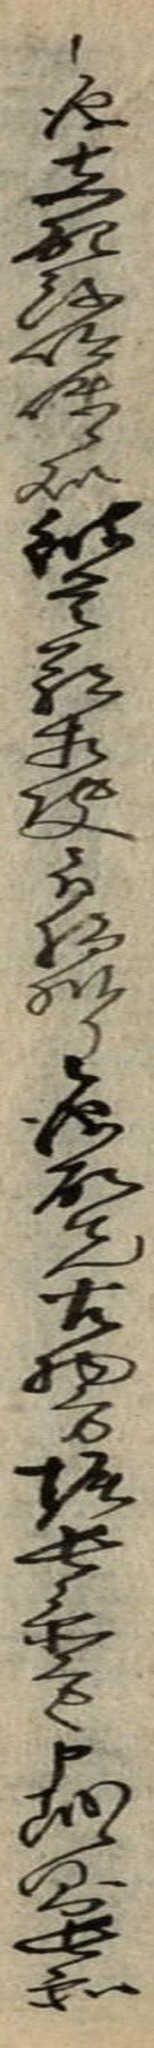之儀支配致吟味候処彼是難相決に付指掛り候儀故先古物方堀長兵衛方へ申越候則長兵衛
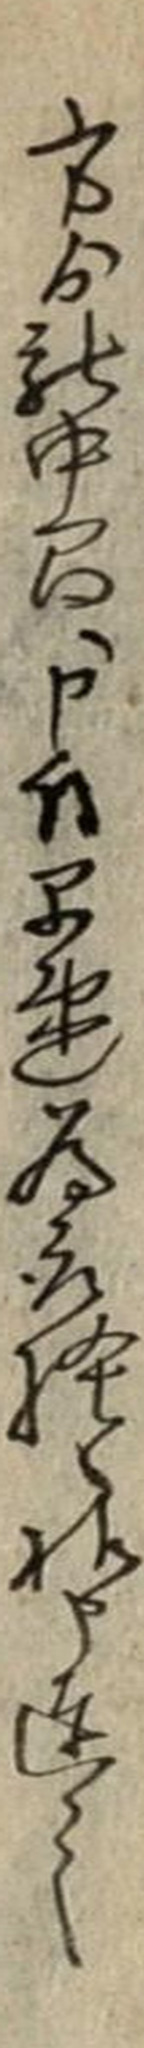方ゟ新中間へ申付早速為取捨候様申達之
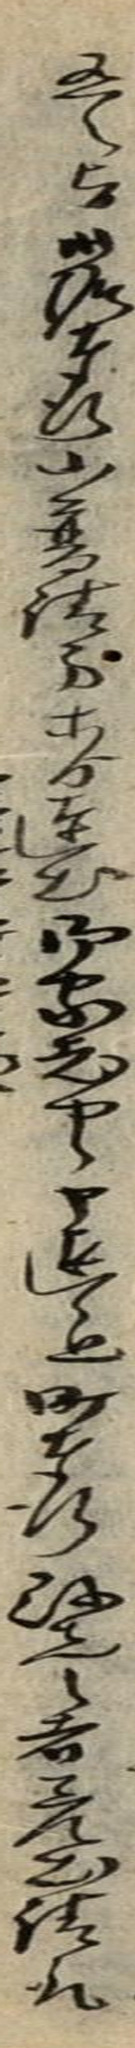有之旨御堀奉行小普請方等ゟ達出御家老中へ申達之上町奉行改先之者差出請取
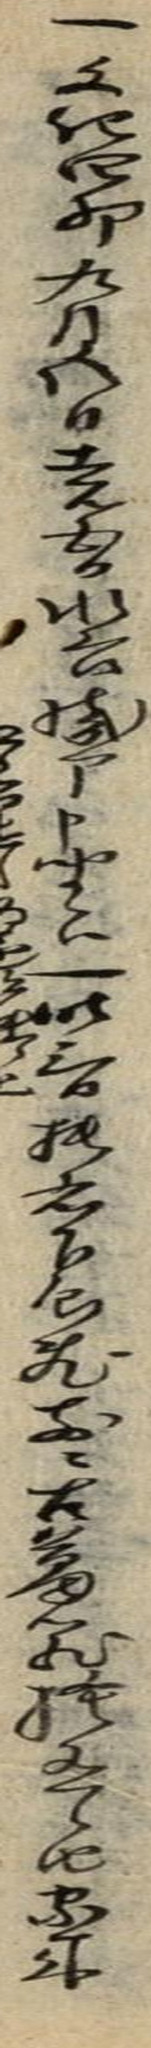一文化四卯九月八日去ル五日水谷織部申聞候は一昨三日拙者下屋敷前に古葛籠捨有之由家来
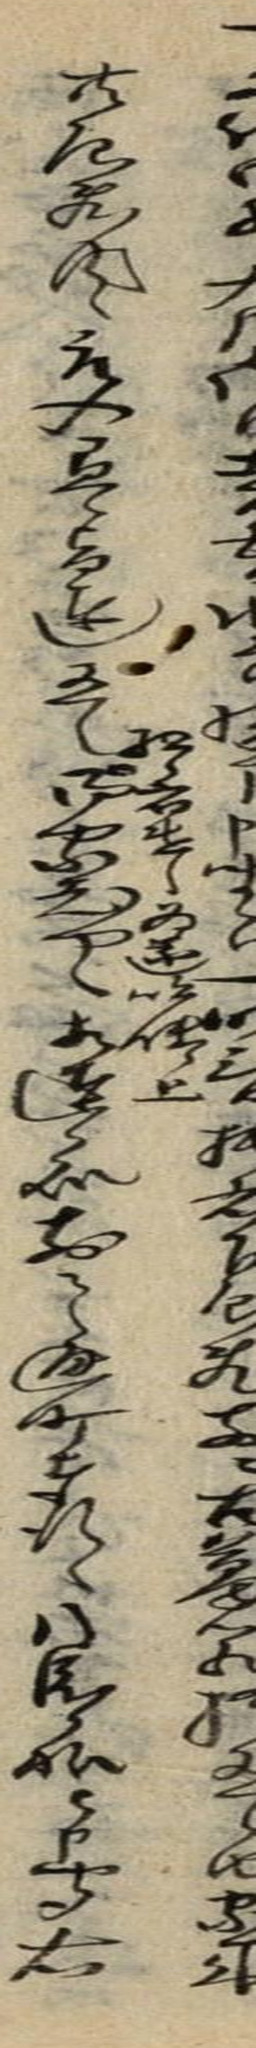共屋敷内へ取入置候旨達有之◦御家老中へ相達組之者遣し為吟味候上候処前々之通町奉行へ引渡候様被申聞右
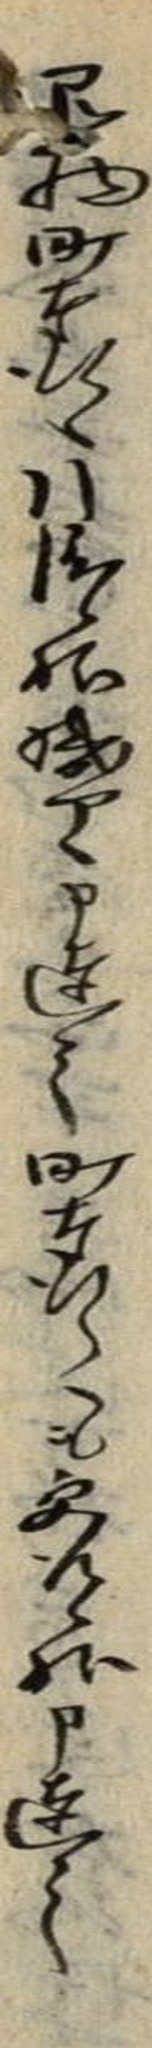品物町奉行へ引渡候様織部へ申達之町奉行へも受取候様申達之
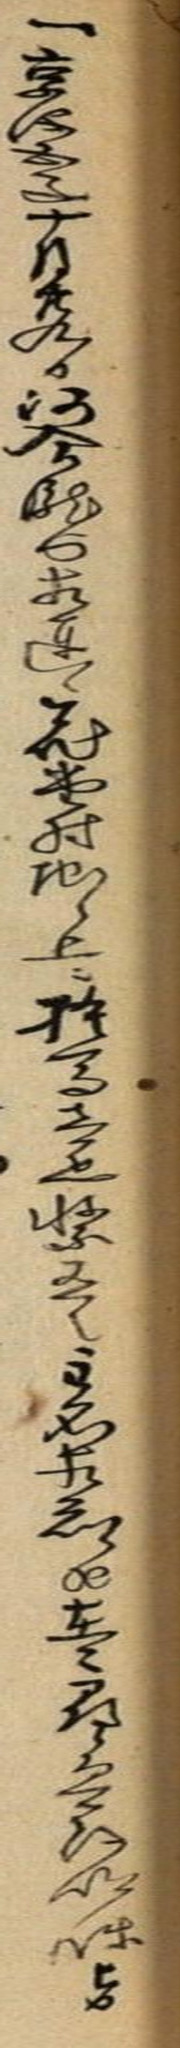一享保五子十月廿九日河合瀧右衛門相達候花堂村地之上に捨馬壱疋繫有之主不相知候由在々尋候て可致吟味旨
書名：御停止異変死失
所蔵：福井県文書館 Fukui Prefectural Archives
